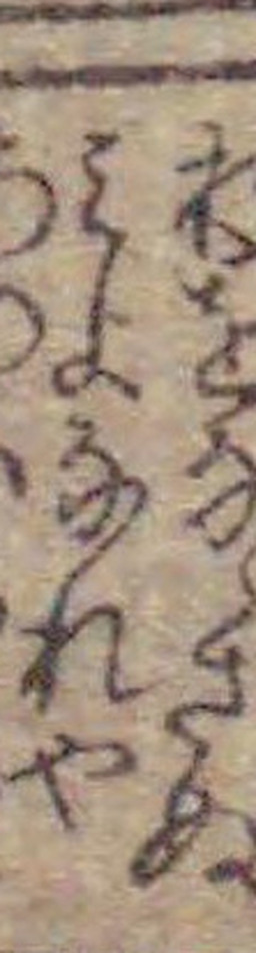みよなれや
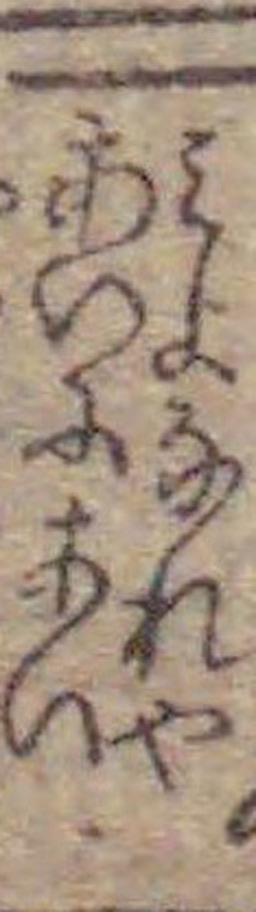あいにあい
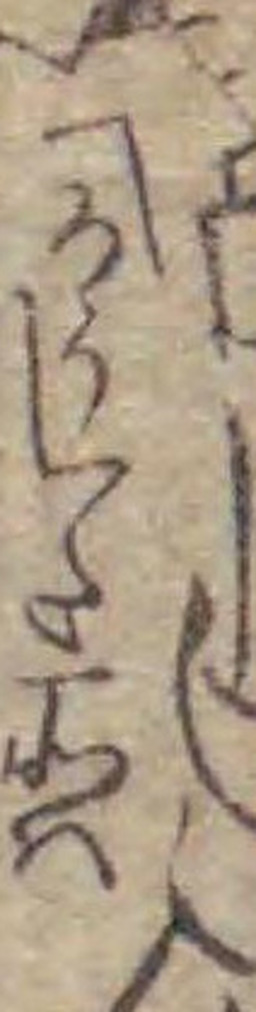〽かうした所は
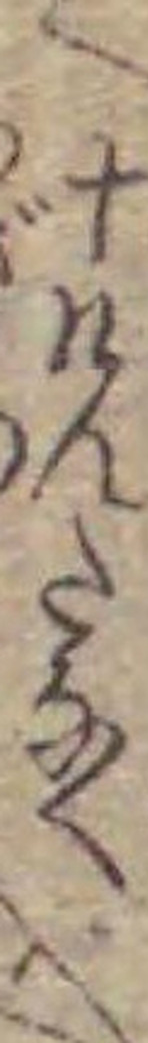十けんたなへ
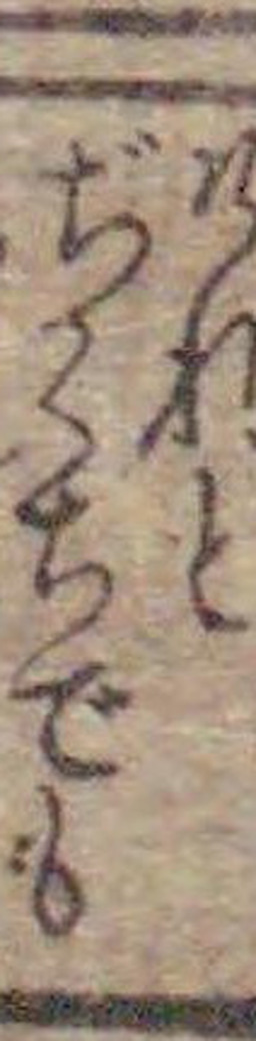ぢくちでも
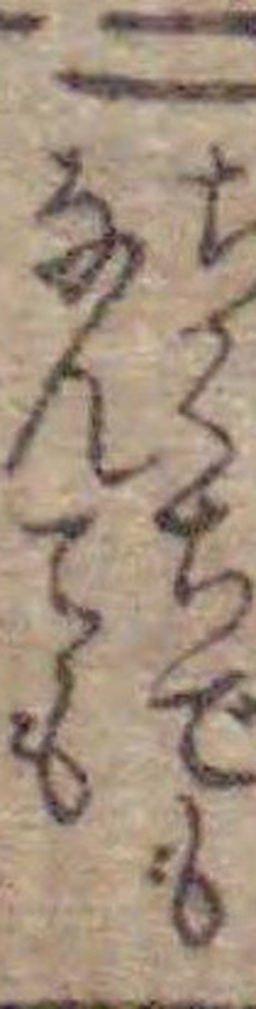なんても
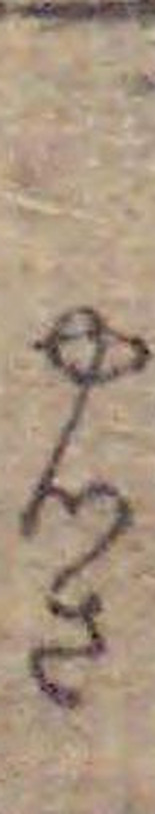やつさ
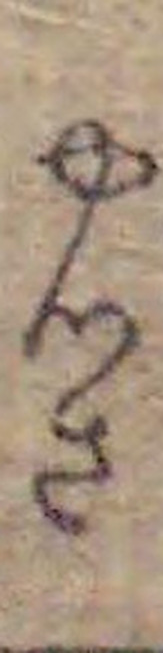やつさ

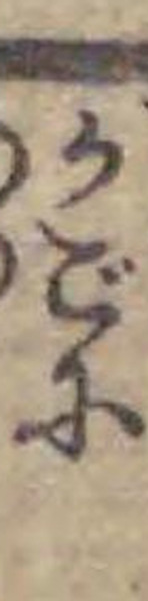かごに
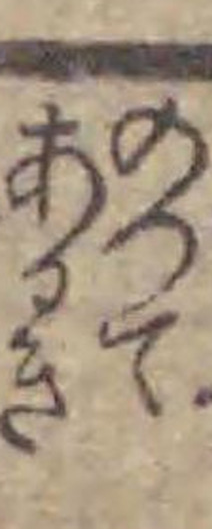あるき
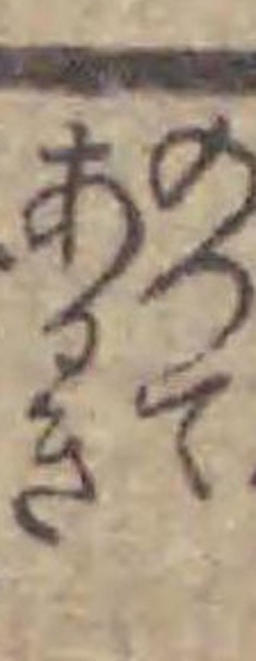あるき
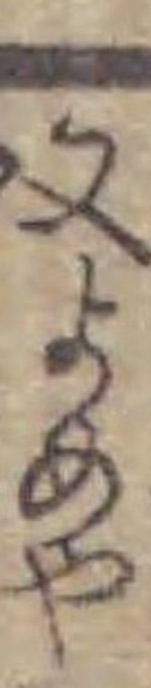又よめや
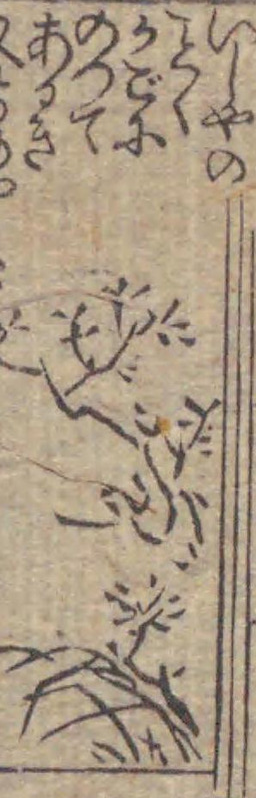かごに
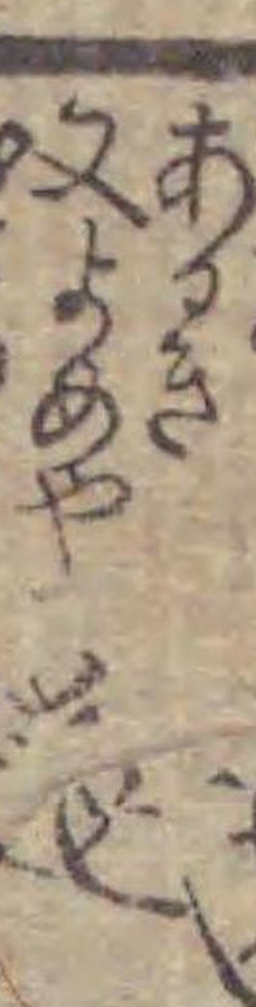又よめや
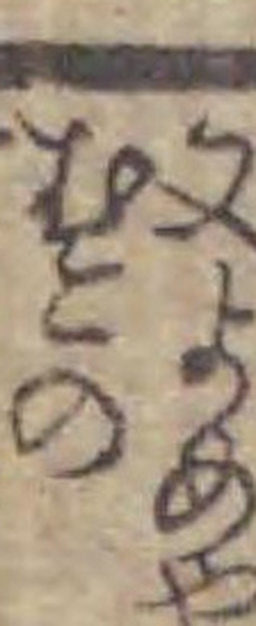むこの
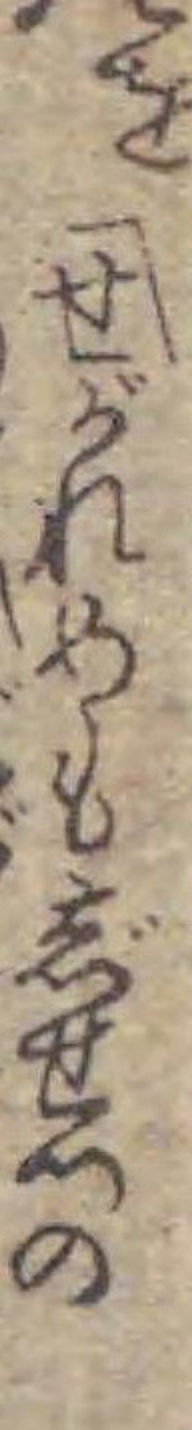〽せがれめもじせつの
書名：奇妙頂礼胎錫杖 : 3巻
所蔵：国立国会図書館 National Diet Library, JAPAN
